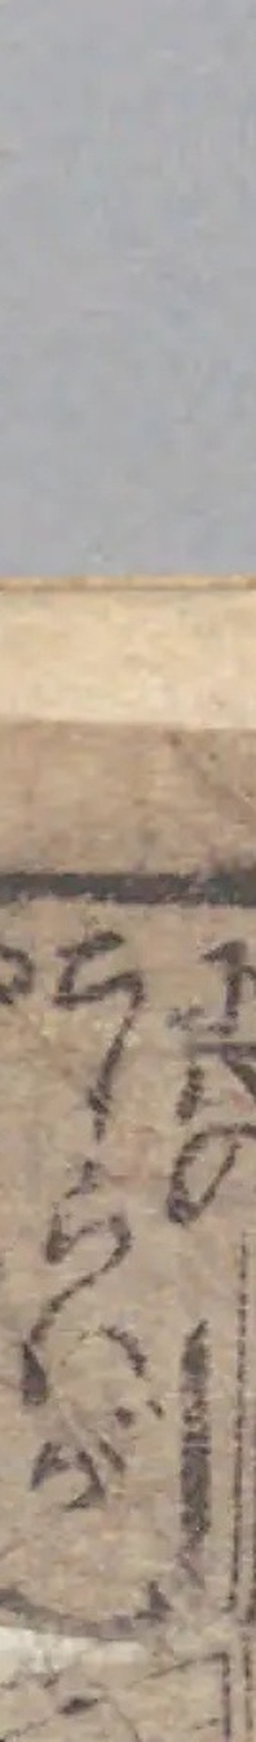こしらいが
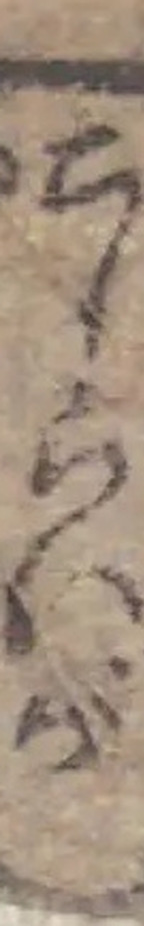こしらいが
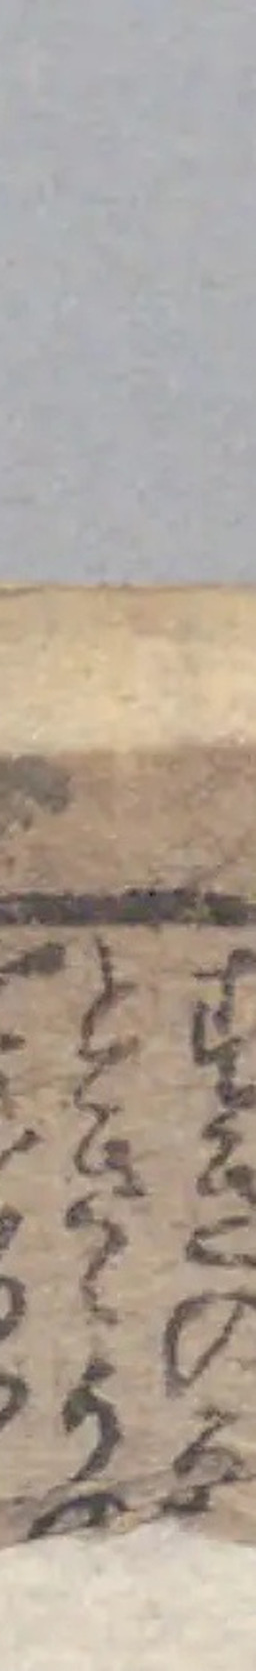ときゝか
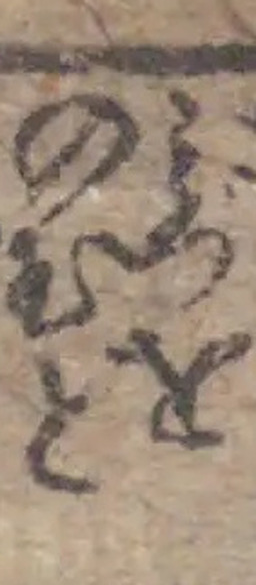のむと
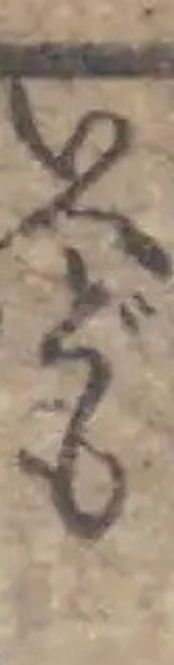いへども
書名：津以曽無弟の甚六 3巻
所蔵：国立国会図書館 National Diet Library, JAPAN
